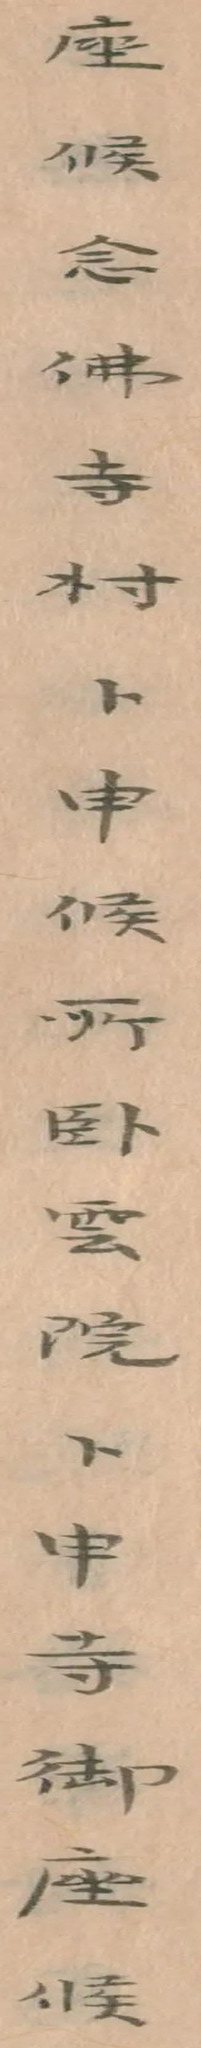座候念仏寺村ト申候所臥雲院ト申寺御座候
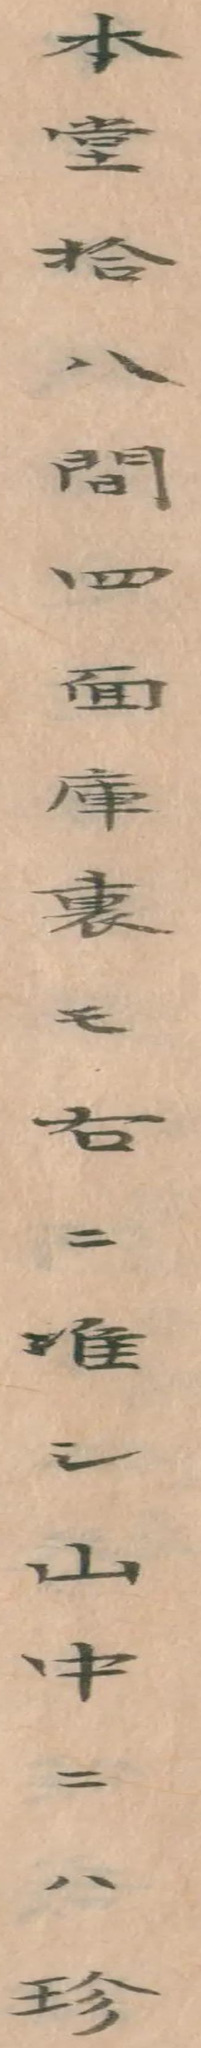本堂拾八間四面庫裏モ右二準シ山中ニハ珍
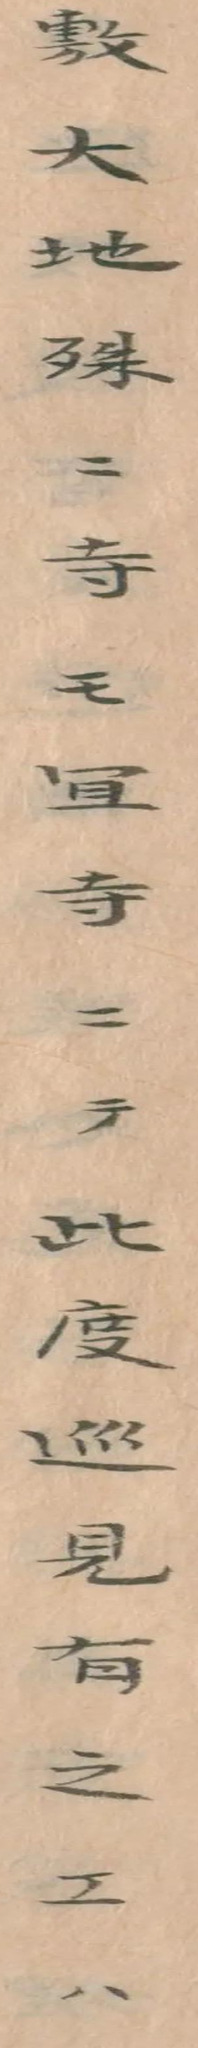敷大地殊二寺モ宜寺ニテ此度巡見有之エハ

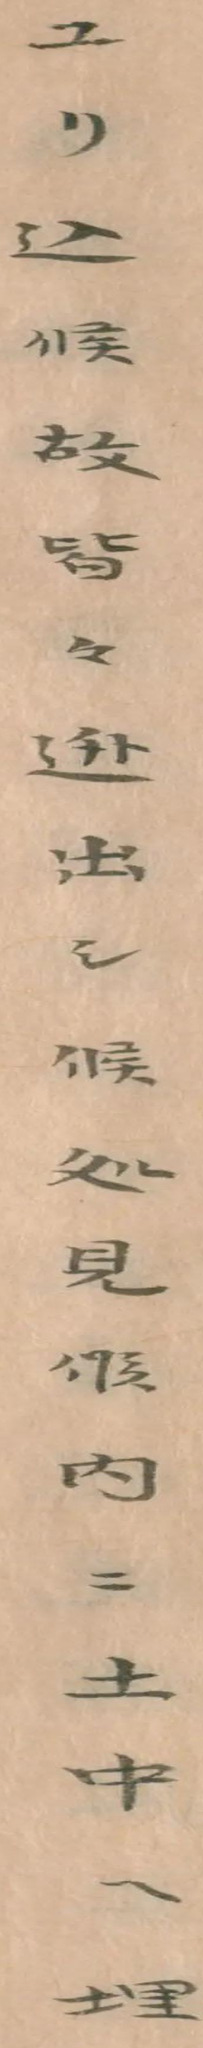ユリ込候故皆々逃出シ候処見候内二土中へ埋
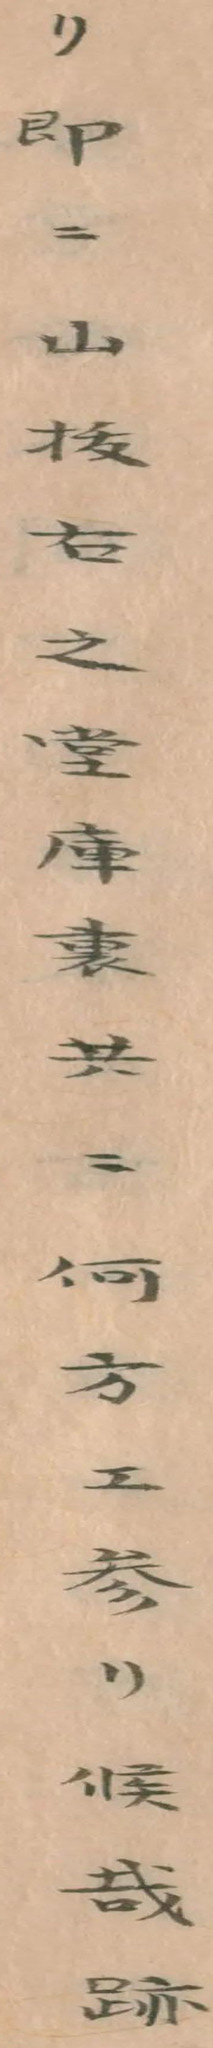り即二山抜右之堂庫裏共二何方エ参り候哉跡
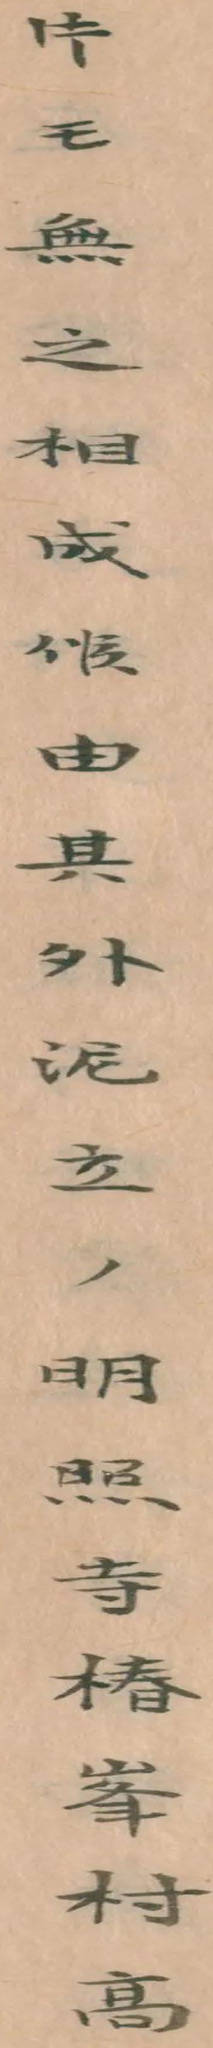片モ無之相成候由其外泥立ノ明照寺椿峯村高
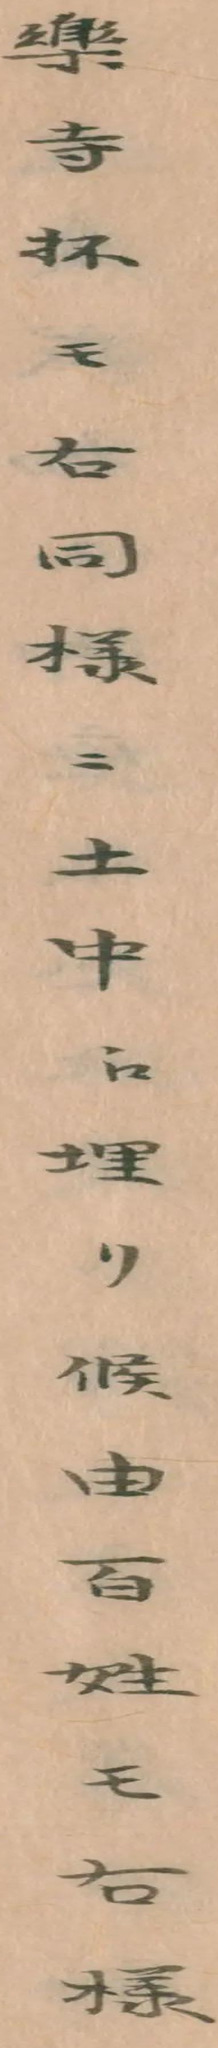楽寺抔モ右同様二土中江埋り候由百姓モ右様
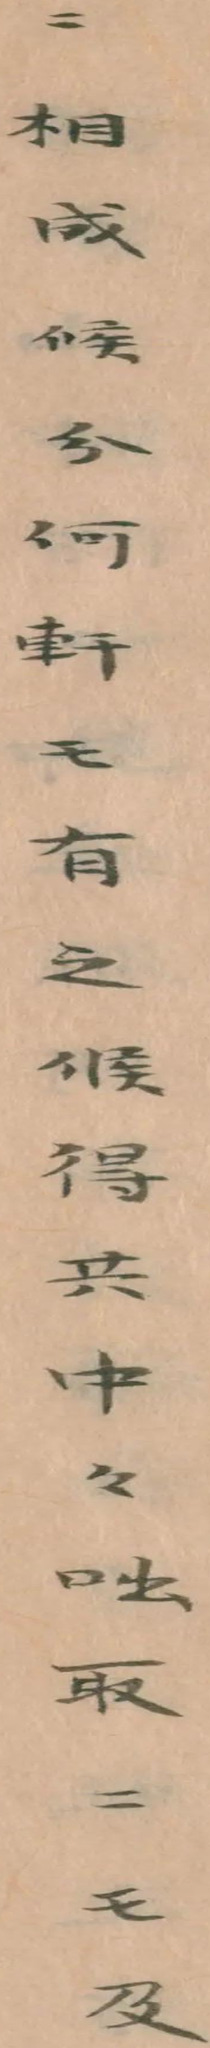二相成候分何軒モ有之候得共中々咄取ニモ及
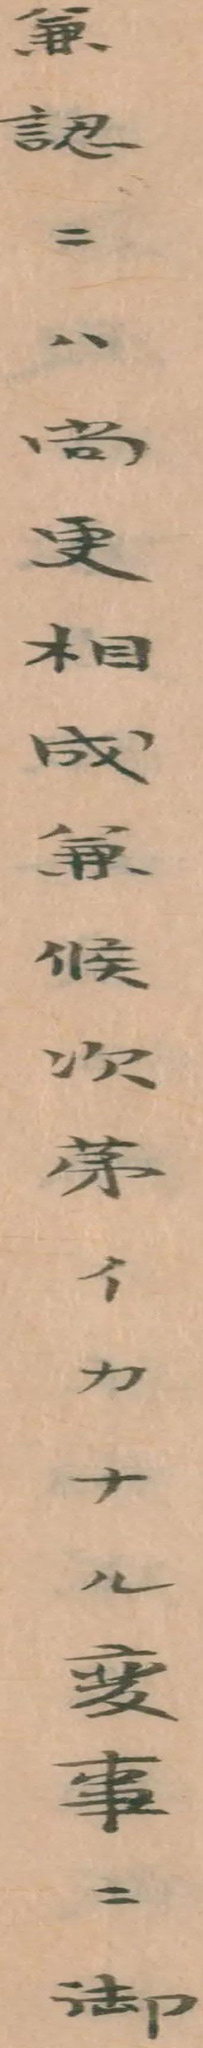兼認ニハ尚更相成兼候次第イカナル変事二御
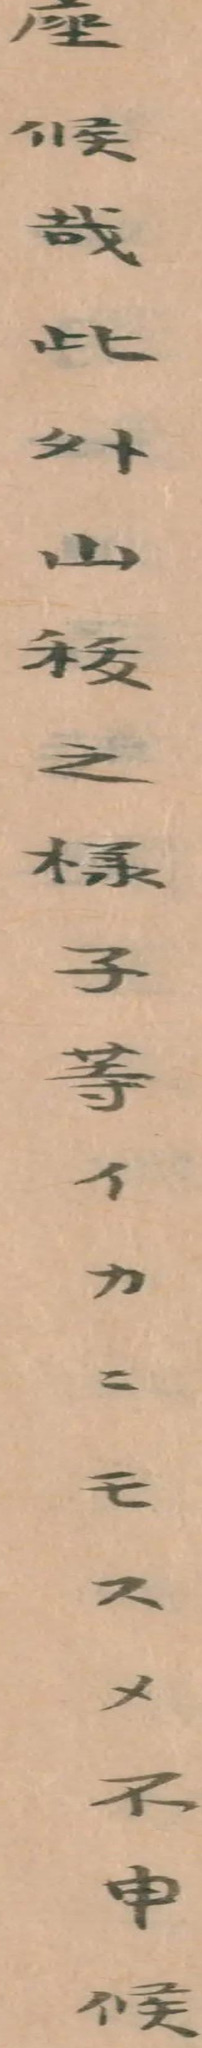座候哉此外山抜之様子等イカニモスメ不申候
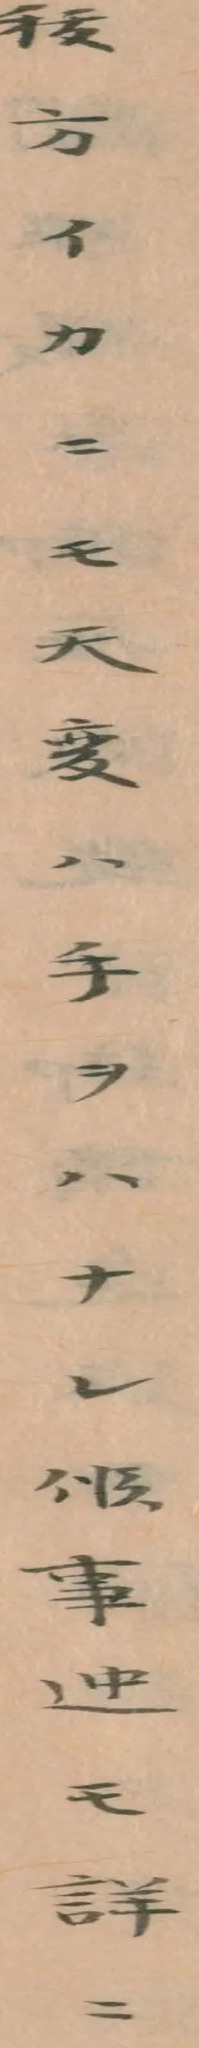抜方イカニモ天変ハ手ヲハナレ候事迚モ詳二
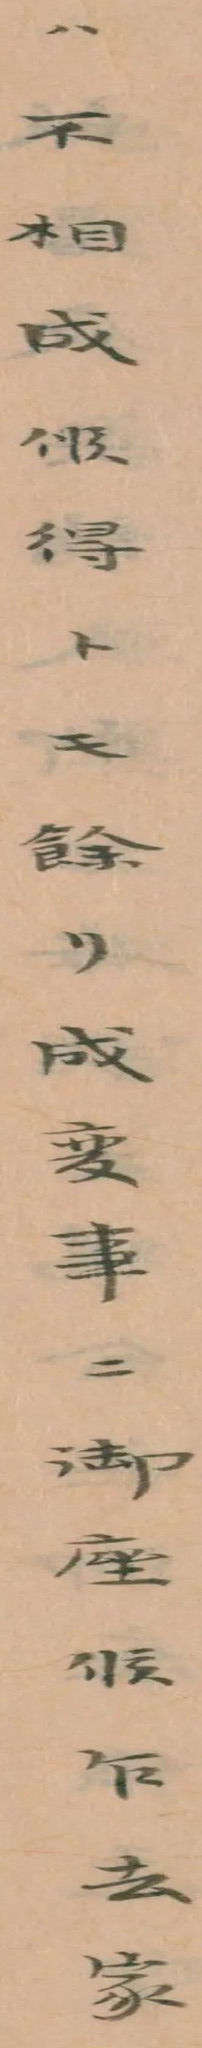ハ不相成候得トモ余り成変事二御座候乍去家
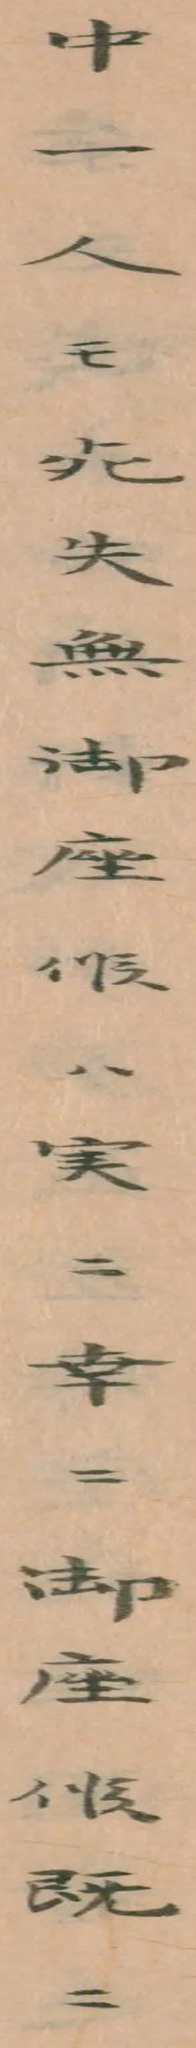注一人モ死失無御座候ハ実二幸二御座候既二
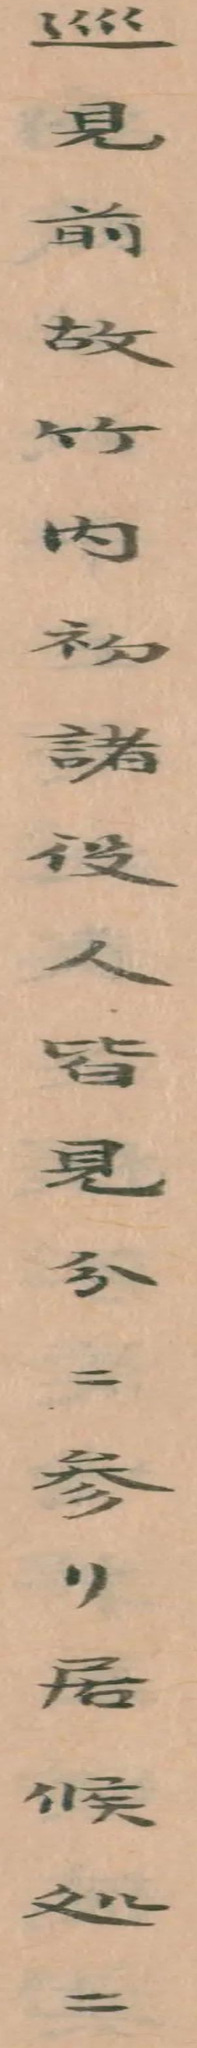巡見前故竹内初諸役人皆見分二参り居候処二
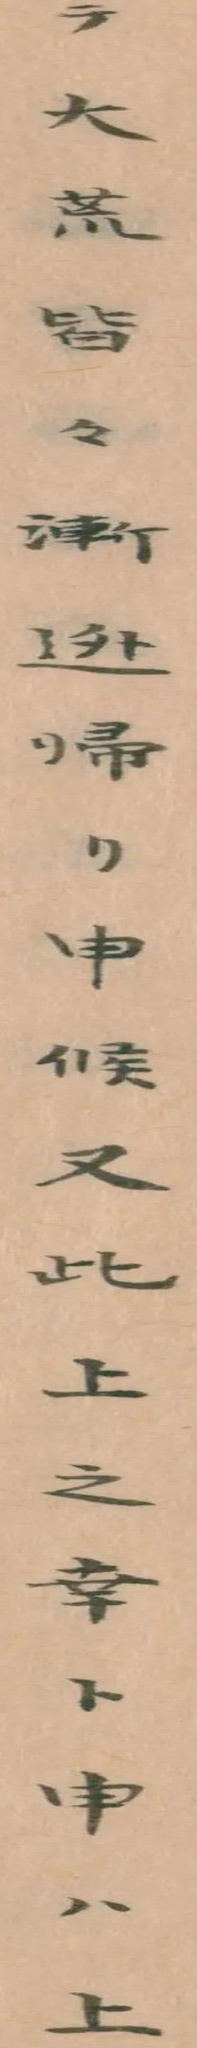テ大荒皆々漸逃帰り申候又此上之幸ト申ハ上
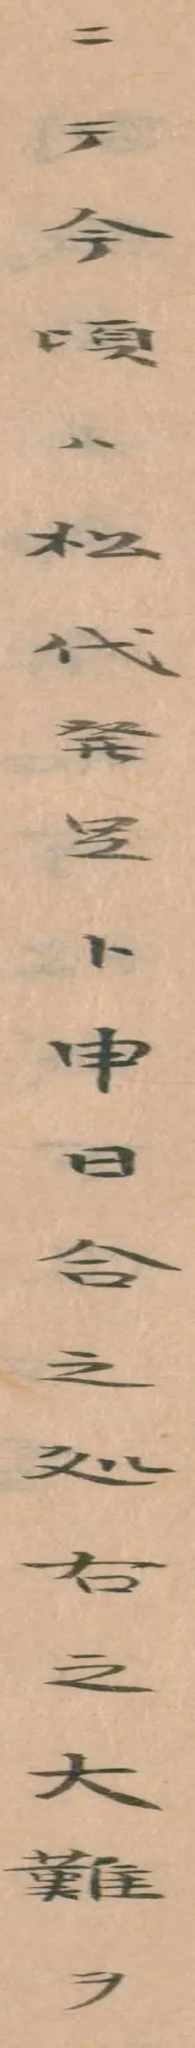ニテ今頃ハ松代発足ト申日合之処右之大難ヲ
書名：地災撮要. 巻1(噴火山・地震ノ部)
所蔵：国立国会図書館 National Diet Library, JAPAN
